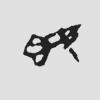既
